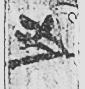之
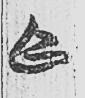𠂤
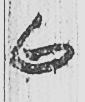㠯（以）
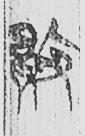敗
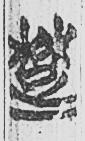楚
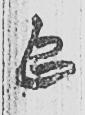𠂤
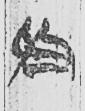於
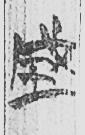城
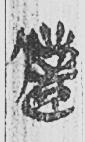{人菐臣}
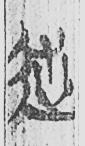述
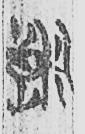朝
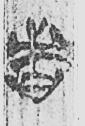周
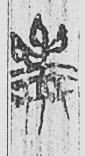襄
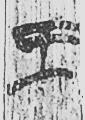王
